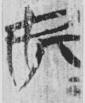𡚦
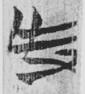拃（作）
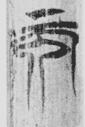而
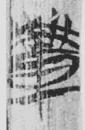𨍱（乘）
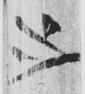之
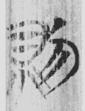則
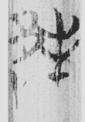邦
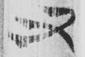又（有）
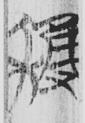穫
